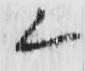乙
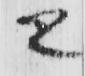巳
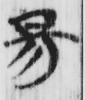昜（陽）
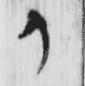人
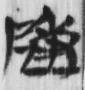○（陳）
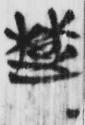楚
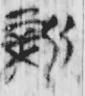新
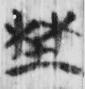埜（野）
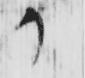人
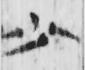少
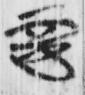妾
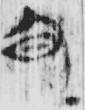和
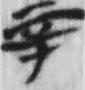辛
